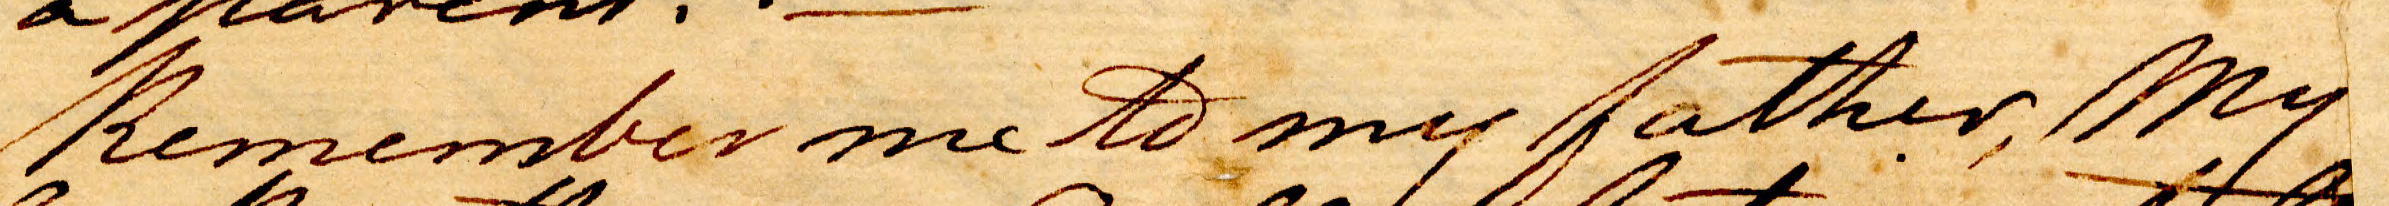Remember me to my father, My
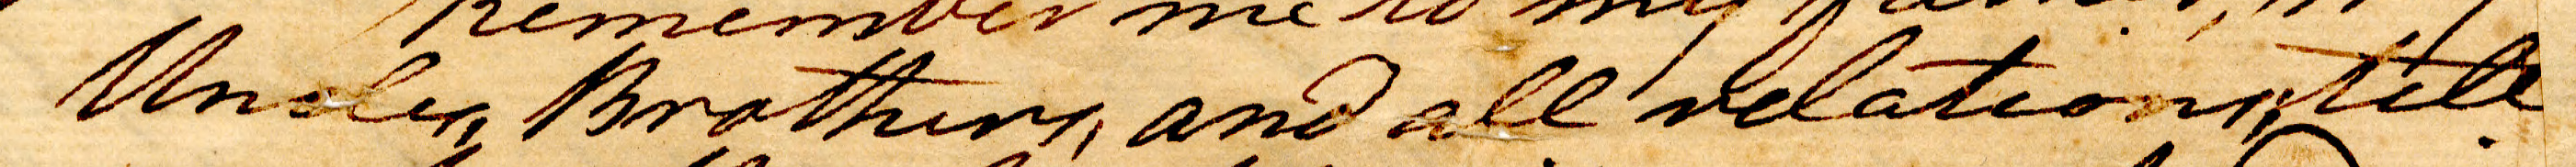Uncles, Brothers, and all relations, tell
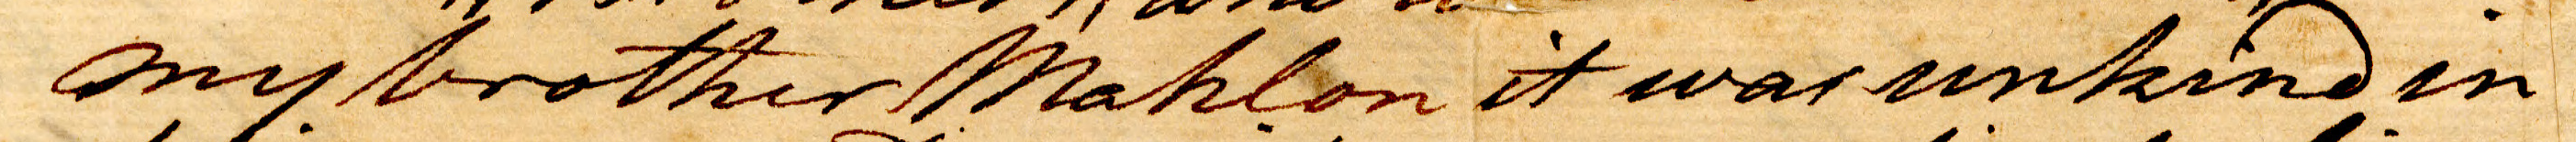my brother Mahlon it was unkind in
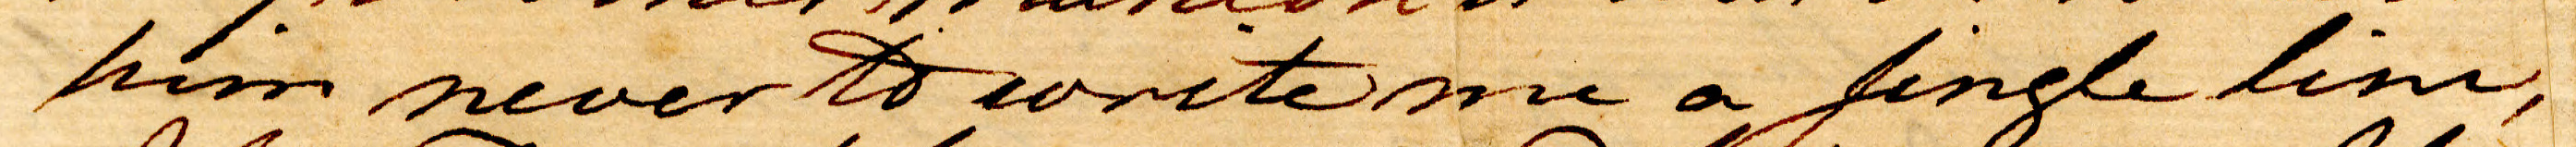him never to write me a single line,
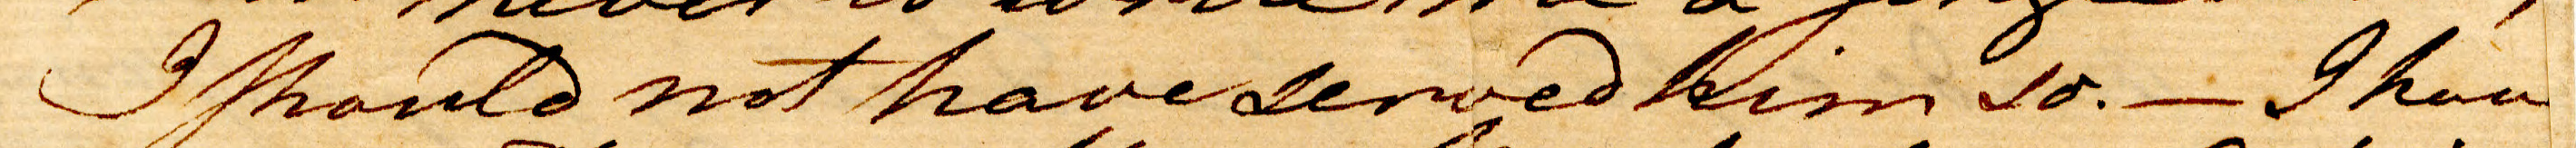I should not have served him so.- I have
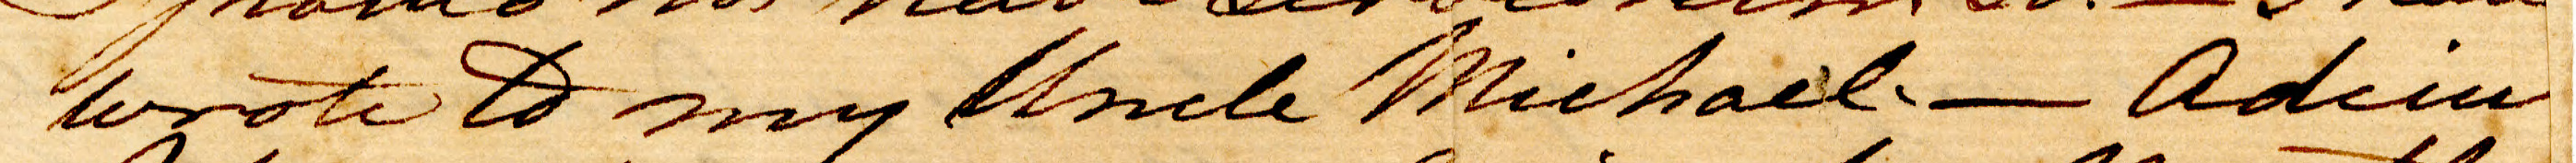wrote to my Uncle Michael.- Adieu
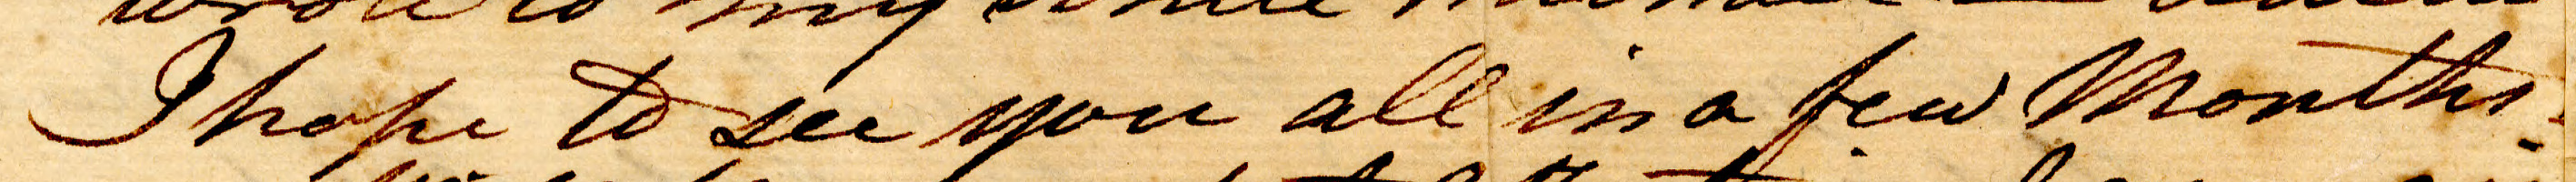I hope to see you all in a few Months
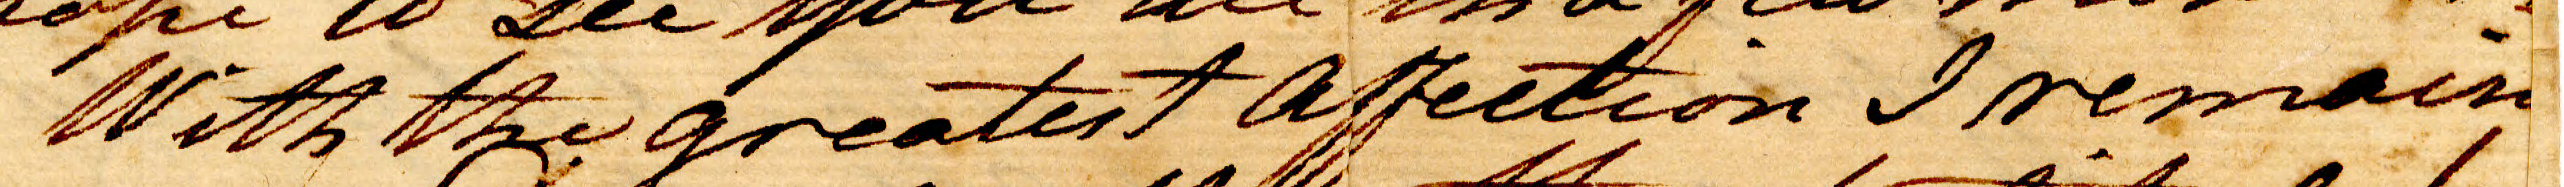With the greatest Affection, I remain
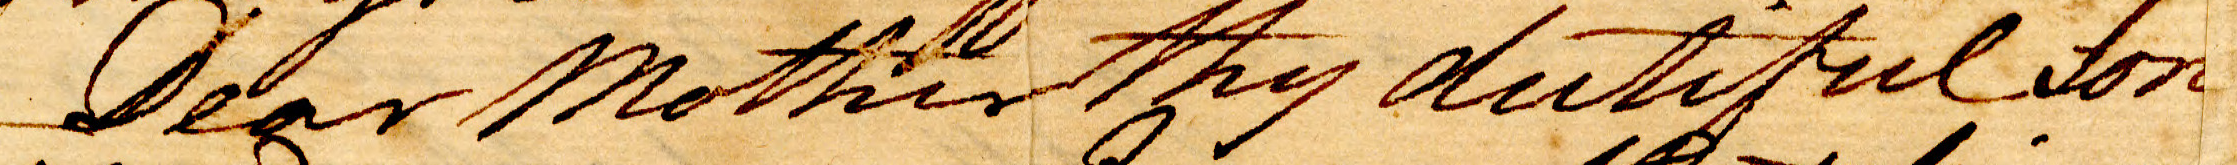Dear Mother thy dutiful Son
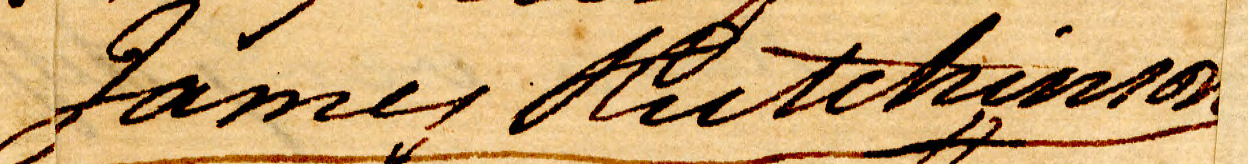James Hutchinson
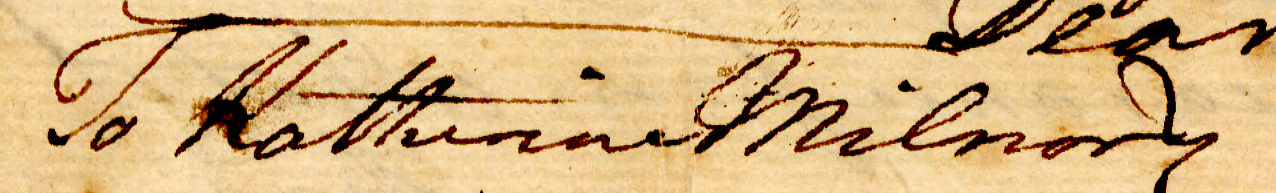To Katherine Milnor
